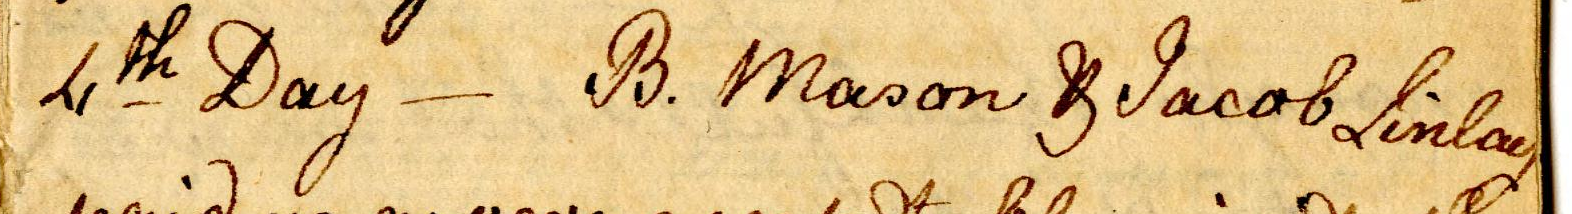4^th Day- B. Mason & Jacob Linlay
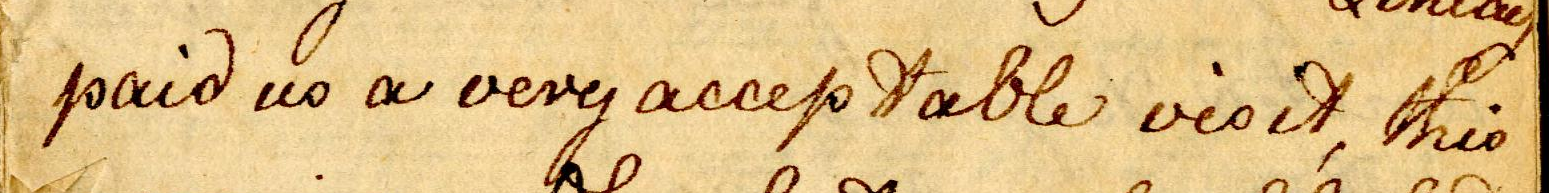paid us a very acceptable visit, this
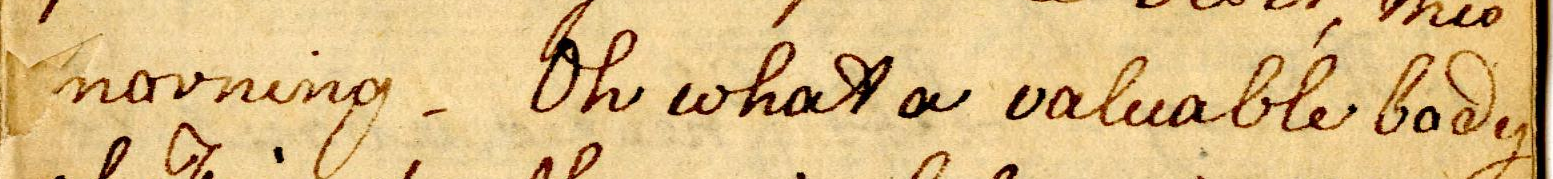[m]orning- Oh what a valuable body
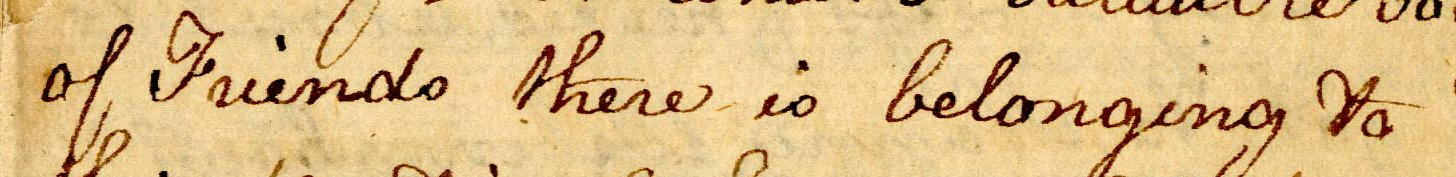of Friends there is belonging to
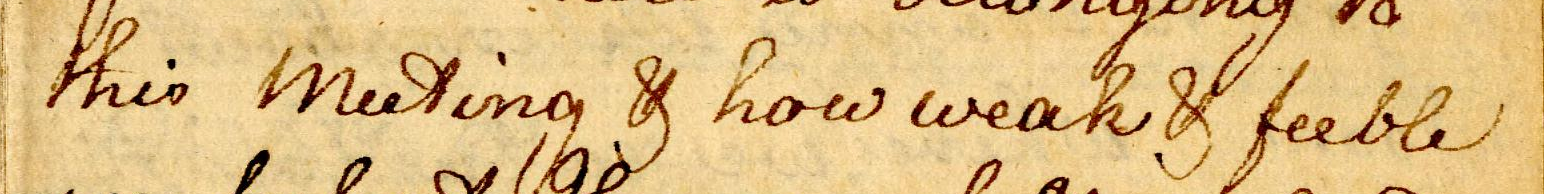this Meeting & how weak & feeble
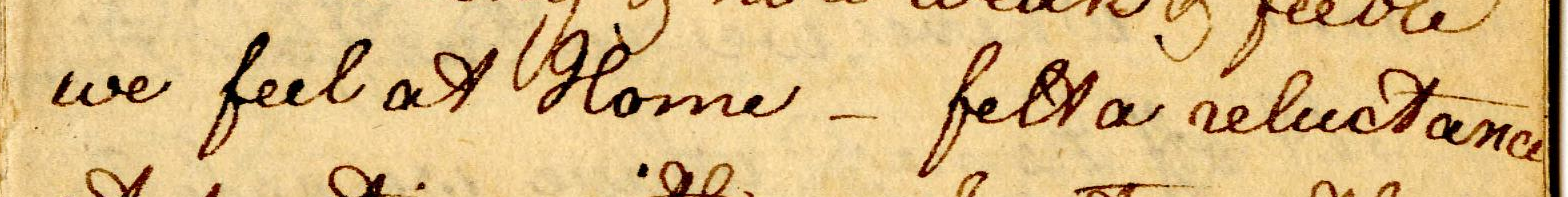we feel at Home- felt a reluctance
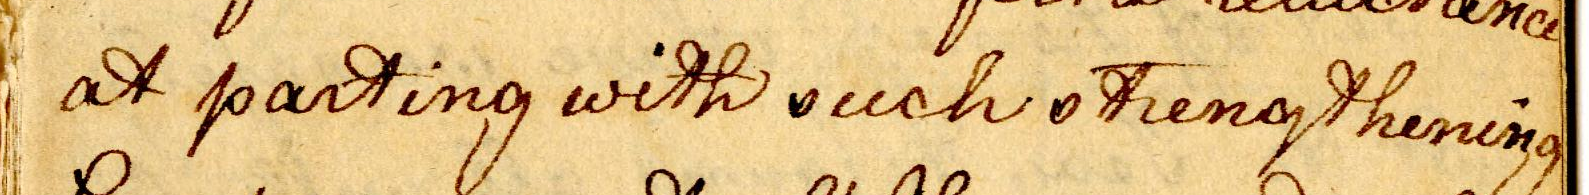at parting with such strengthening
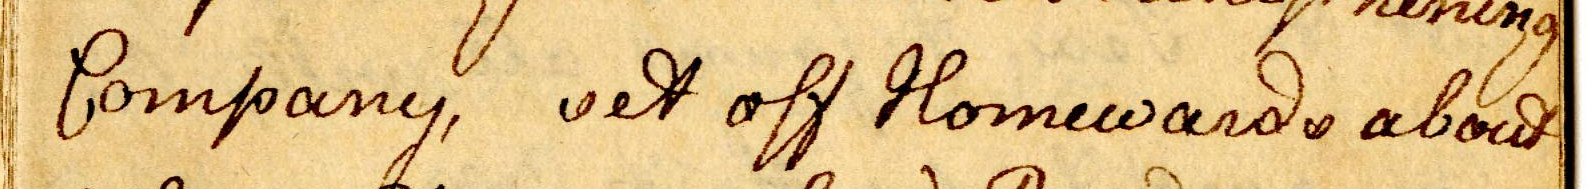Company, set off Homewards about
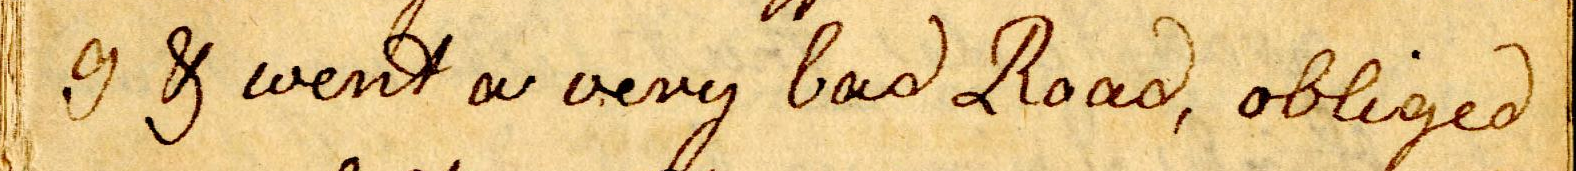9 & went a very bad Road, obliged
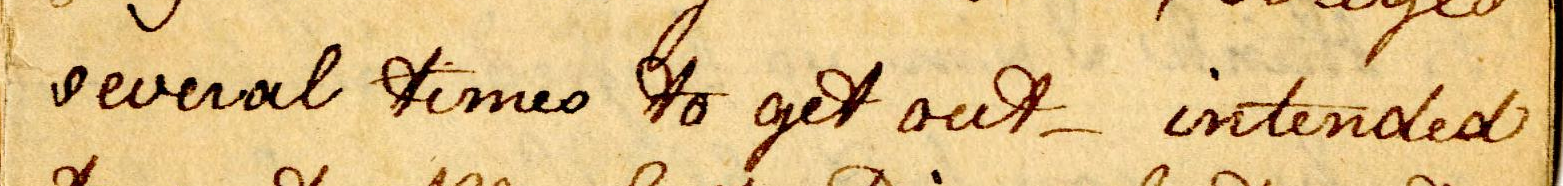several times to get out- intended
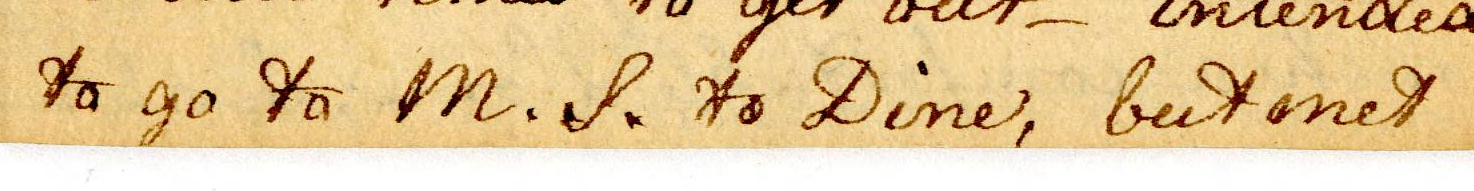to go to M. S. to Dine, but met
